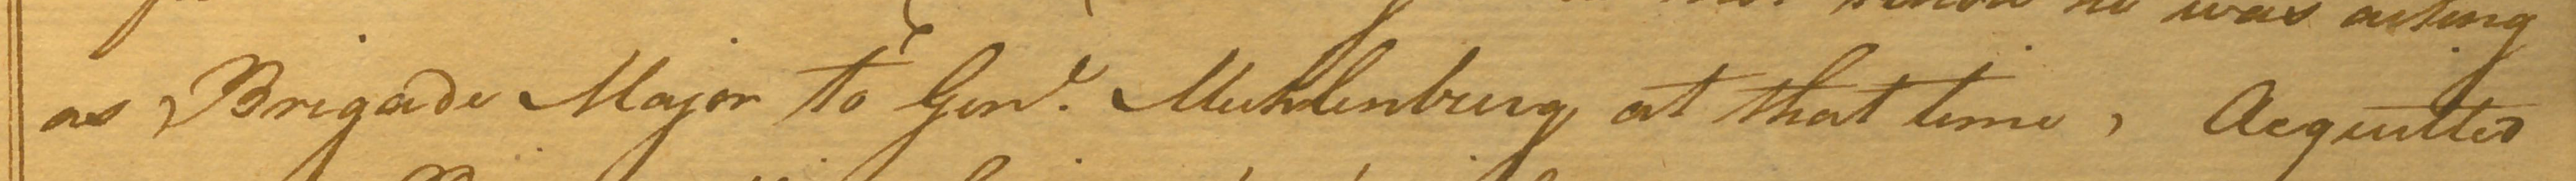as Brigade Major to Gen^l. Muhlenburg at that time, Acquitted
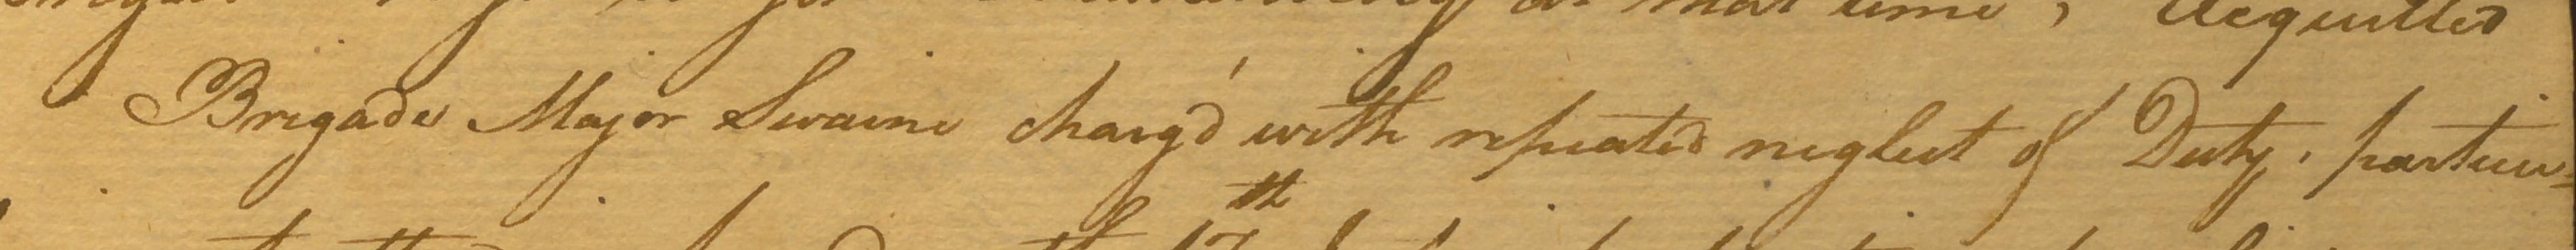Brigade Major Swain charg'd with repeated neglect of Duty particu-
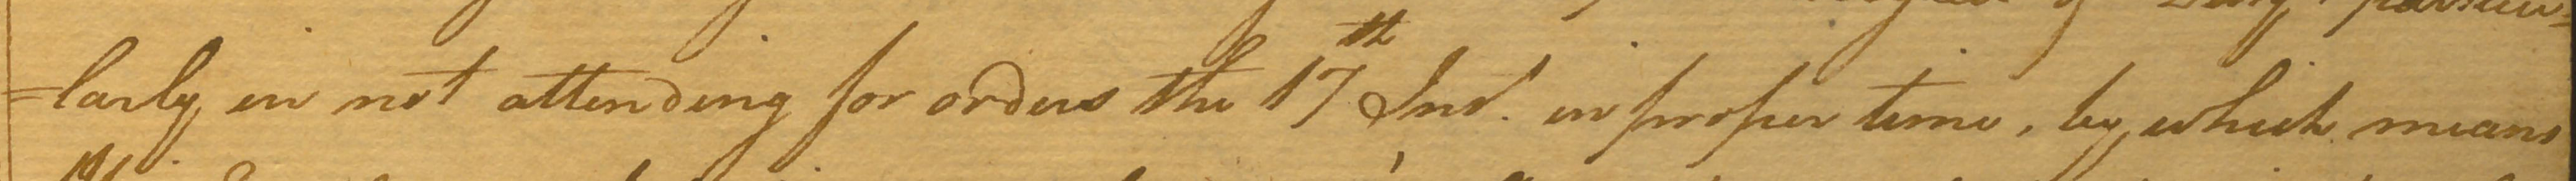-larly in not attending for orders the 17^th. Inst. in proper time, by which means
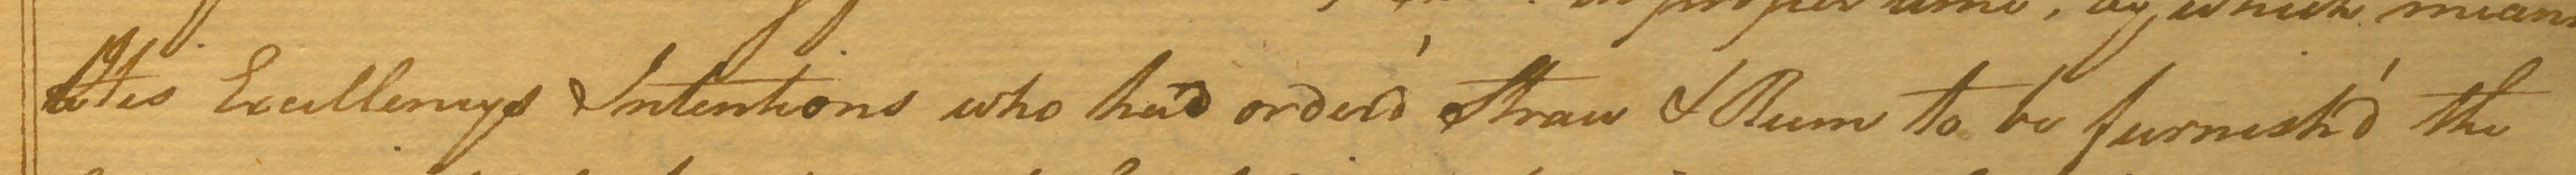His Excellencys Intentions who had order'd Straw & Rum to be furnish'd tho
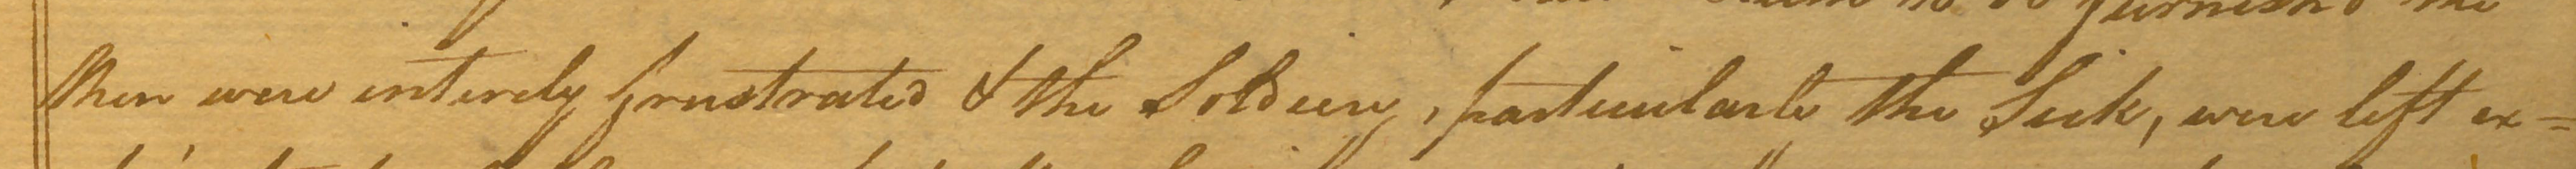then were intirely frustrated & the Soldiers, particularly the Sick, were left ex-
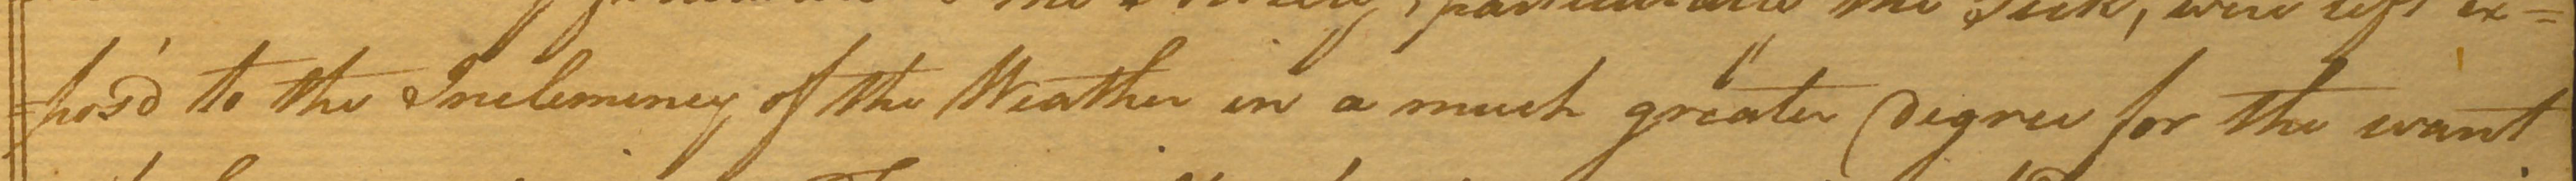pos'd to the Inclemency of the Weather in a much greater degree for the want
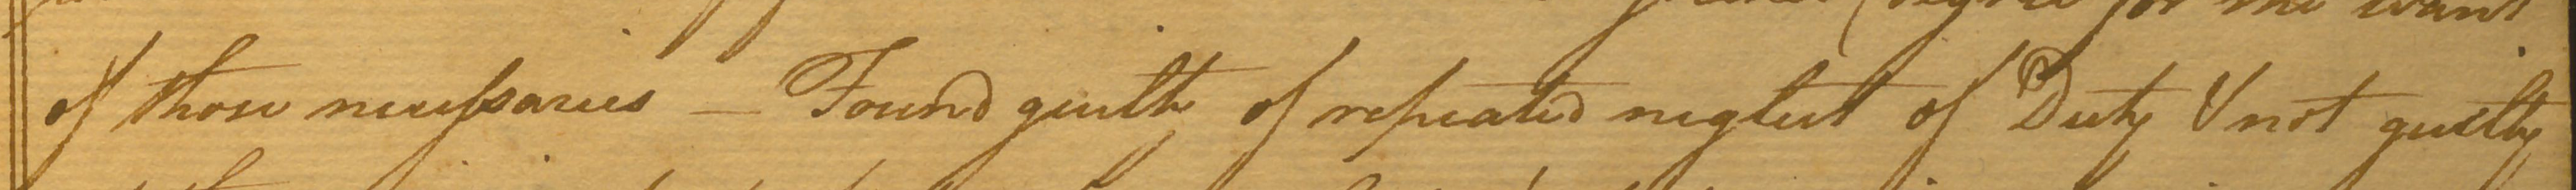of those necessaries- Found guilty of repeated neglect of Duty & not guilty
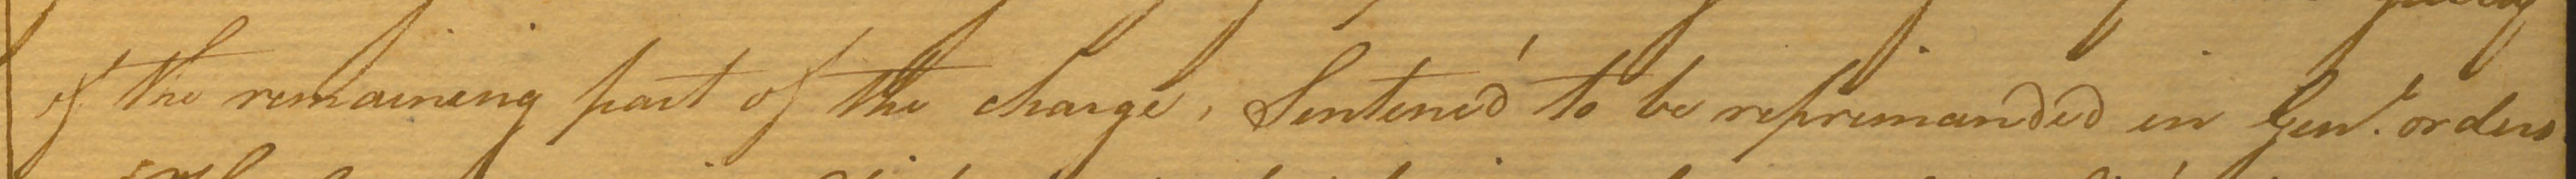of the remaining part of the charge, Sentenc'd to be reprimanded in Gen^l orders
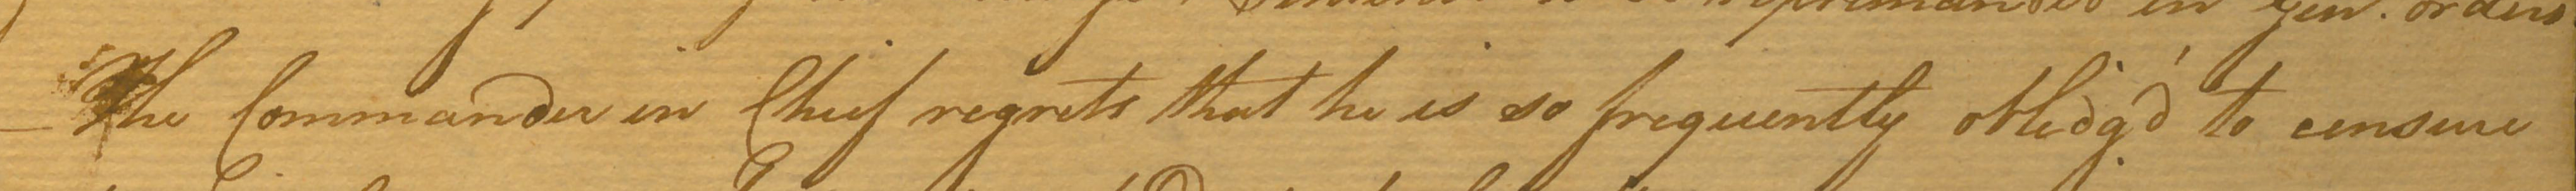The Commander in Chief regrets that he is so frequently oblidg'd to ensure
